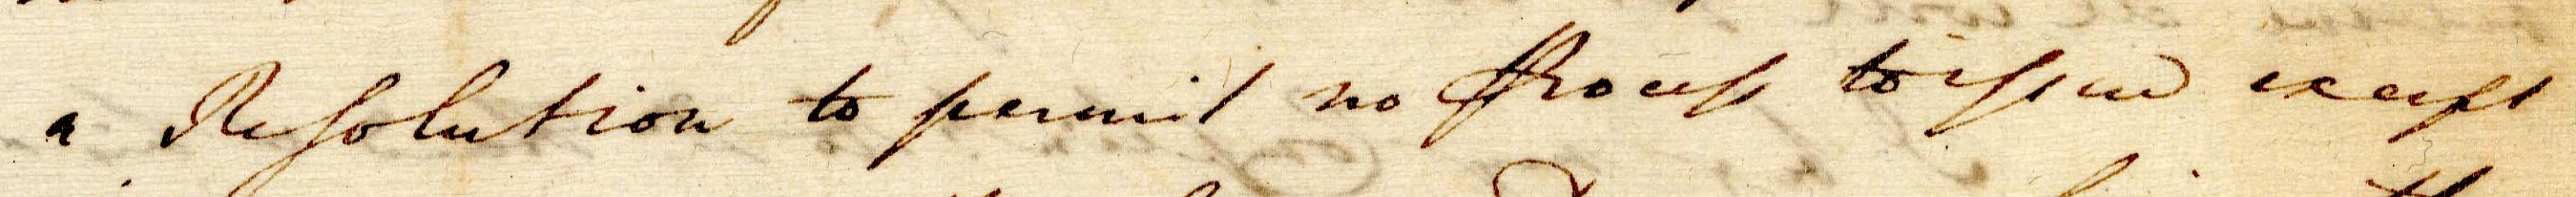a Resolution to permit no Process to issue excess
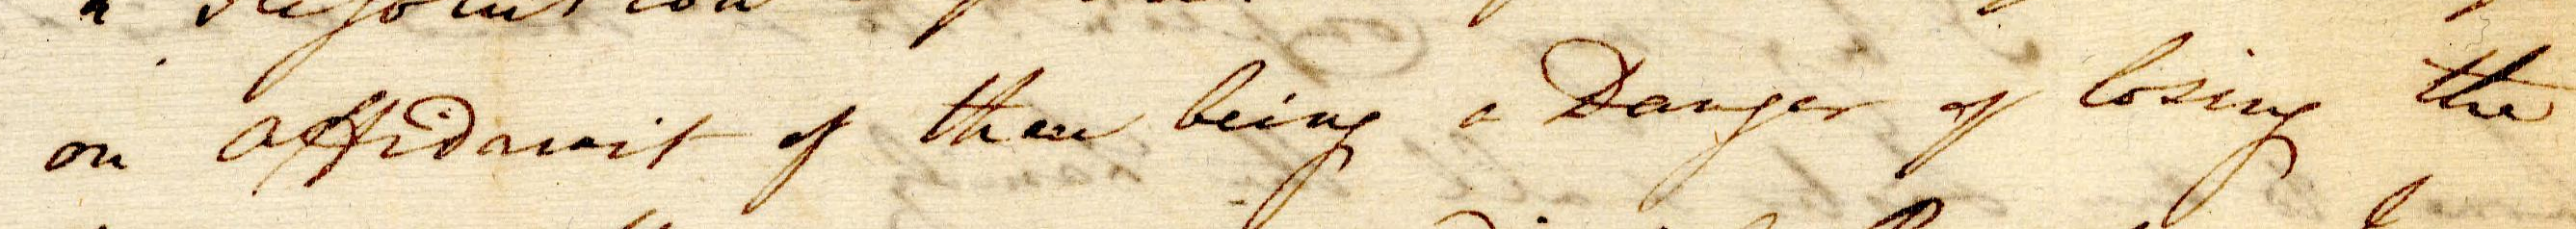on affidavit of these being a Danger of losing the
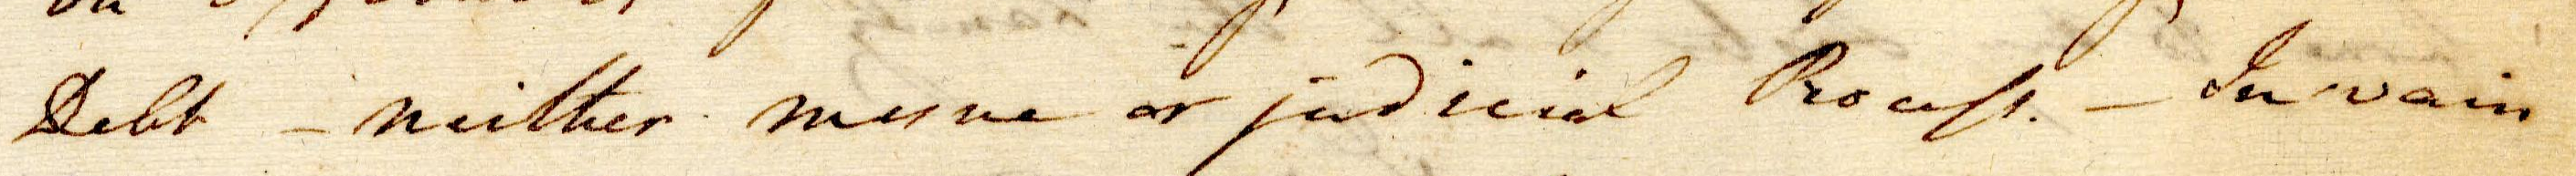Debt. Neither misue or judicial Process. In vain
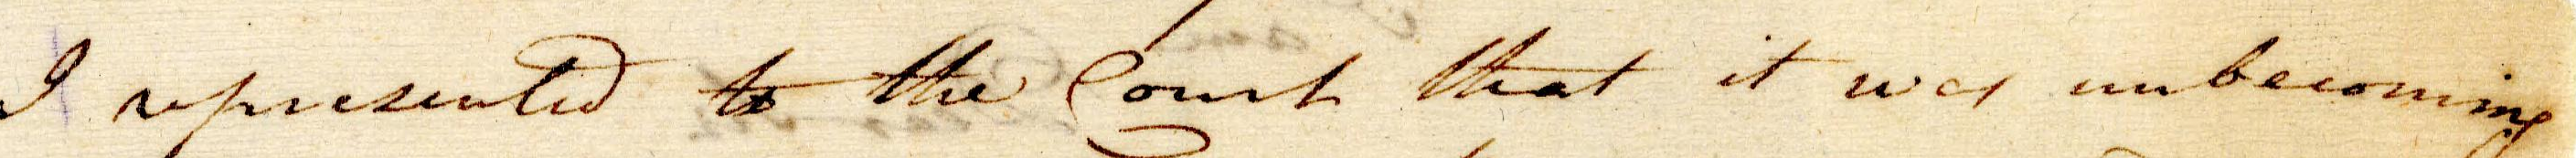I represented to the Court that it was unbecoming
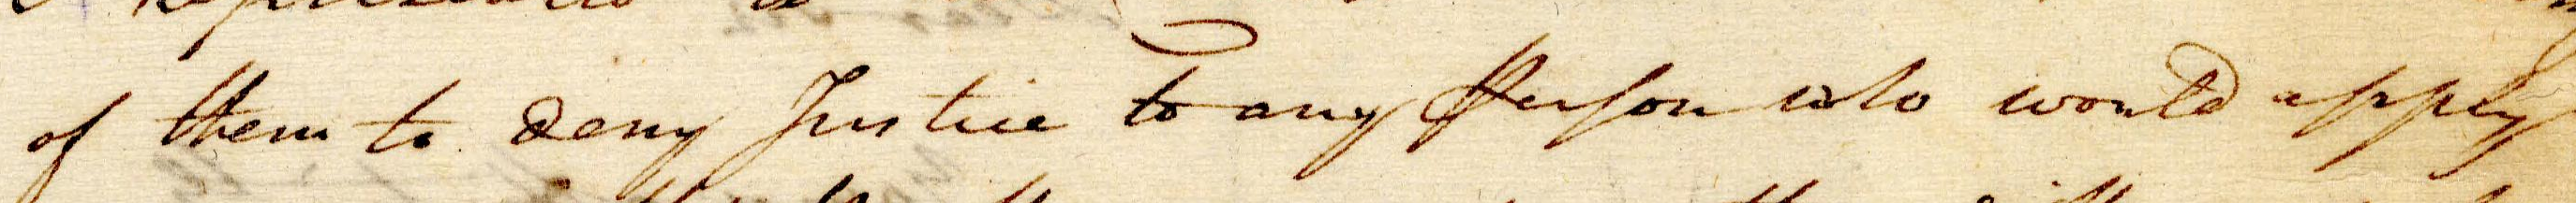of them to deny Justice to any Person who would apply
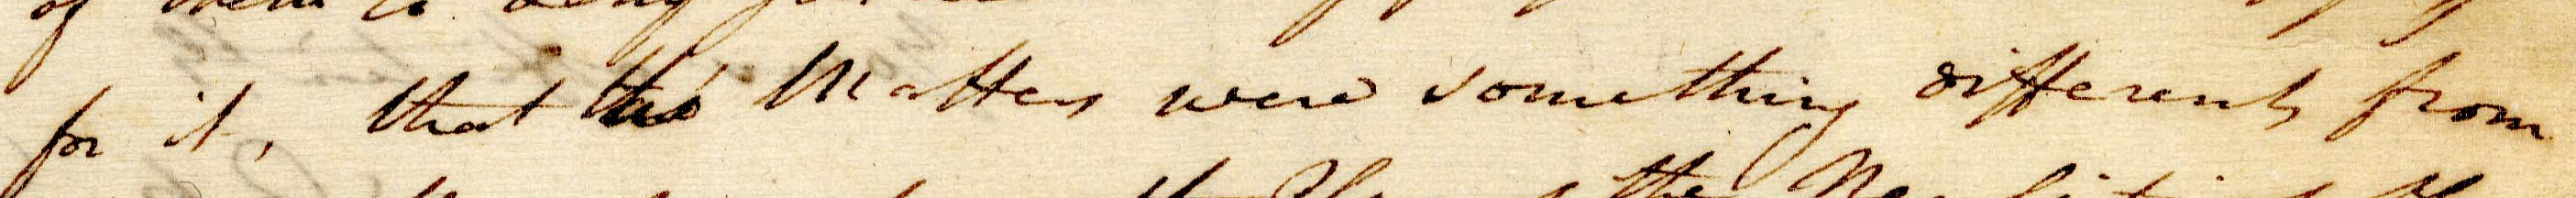for it, that tho' Matters were some thing different from
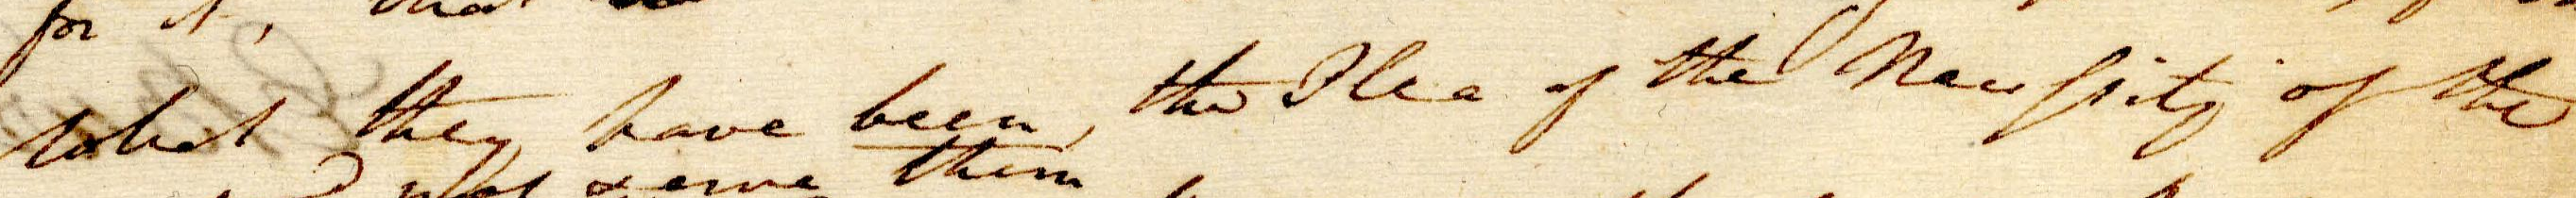what they have been, the Plea of the Necessity of the
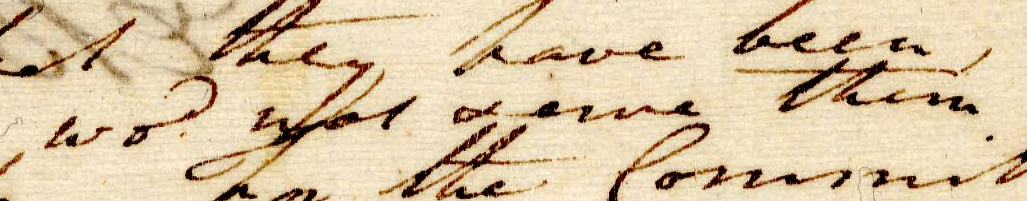wo^d not serve them
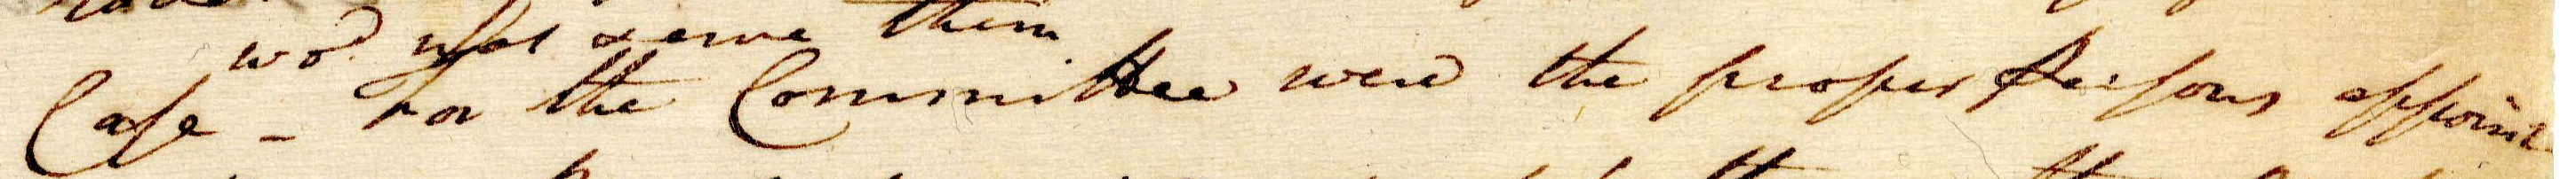Case ^ For the Committee were the proper Persons appoint-
